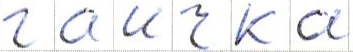гаичка
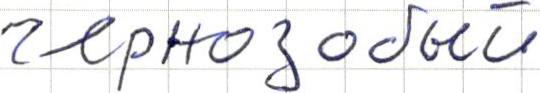чернозобый
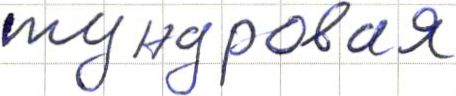тундровая
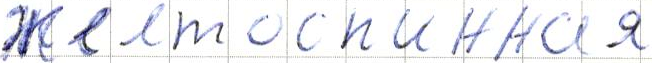желтоспинная
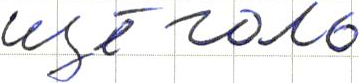щёголь
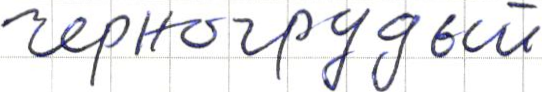черногрудый
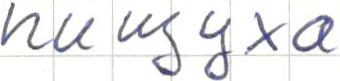пищуха
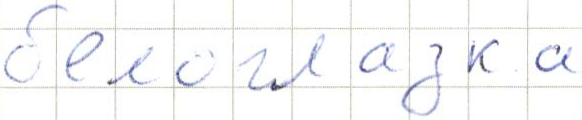белоглазка
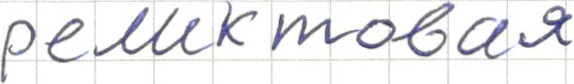реликтовая
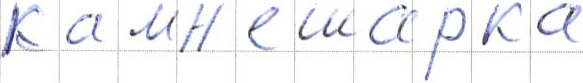камнешарка
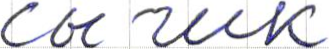сычик
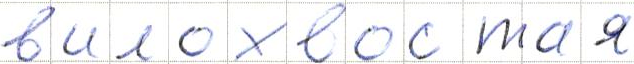вилохвостая
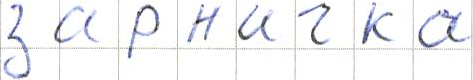зарничка
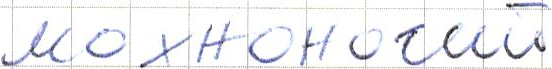мохноногий
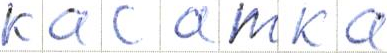касатка
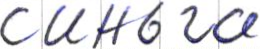синьга
